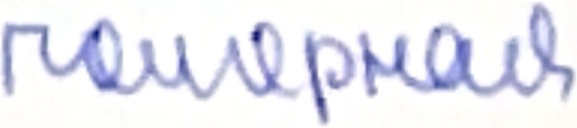полярная
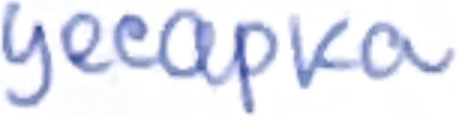уесарка
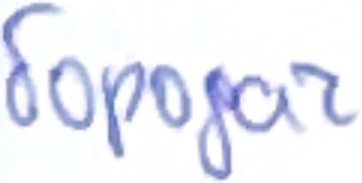бородач
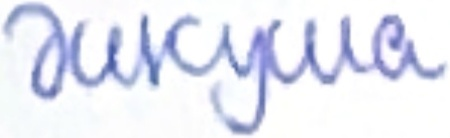дикуша
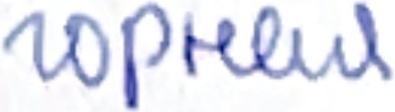горная
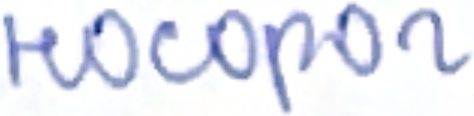носорог
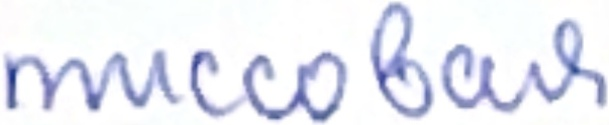тиссовая
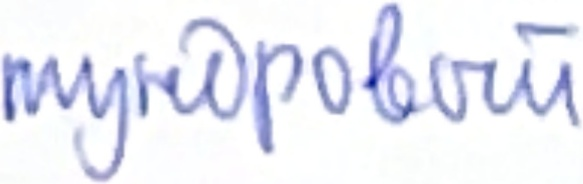тундровый
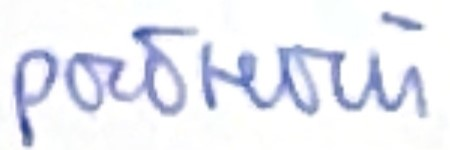рыбный
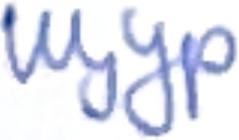щур
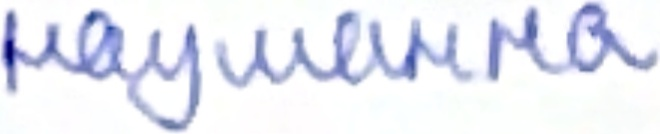науманна
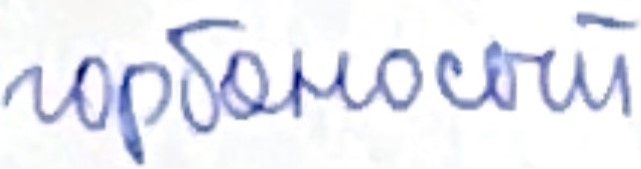горбоносый
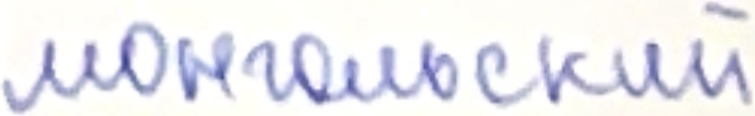монгольский
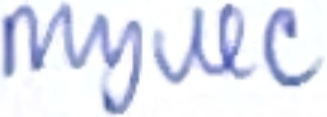тулес
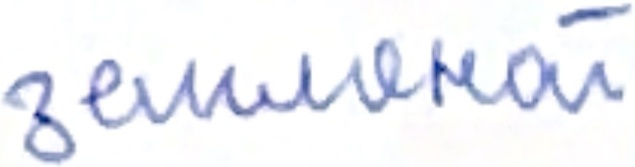земляной
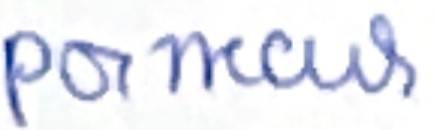рыжая
